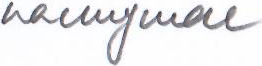пастушок
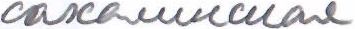сахалинская
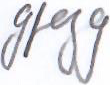дрозд
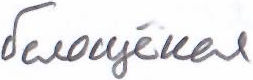белощёкая
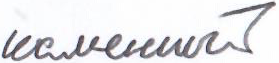каменный
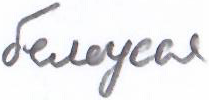белоусая
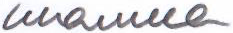ипатка
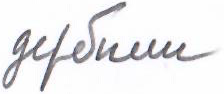дербник
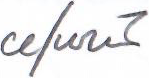серый
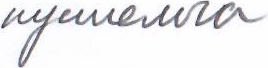пустельга
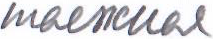таежная
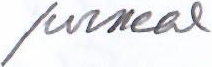рыжая
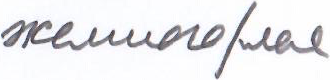желтогорлая
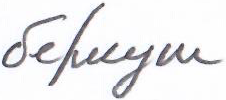беркут
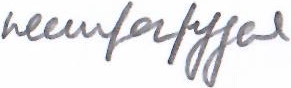пестрогрудая
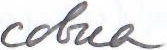совка
